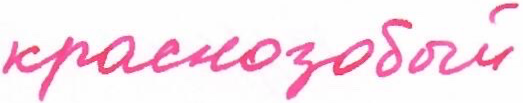краснозобый
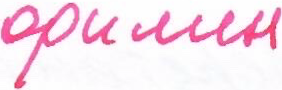филин
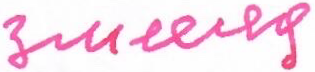змееяд
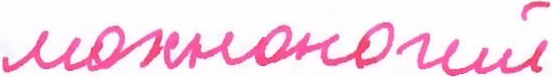мохноногий
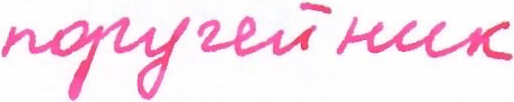поручейник
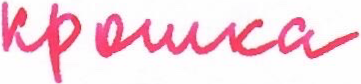крошка
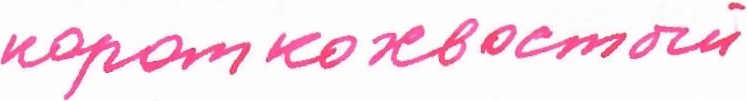короткохвостый
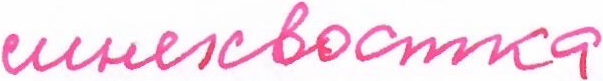синехвостка
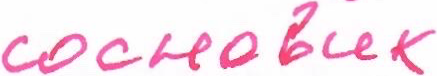сосновик
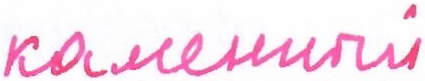каменный
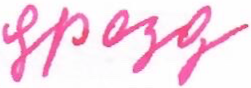дрозд
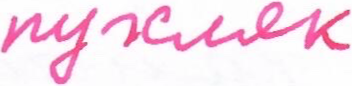пухляк
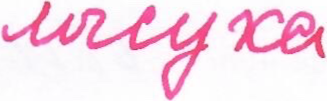лысуха
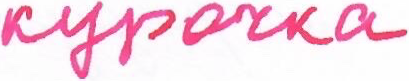курочка
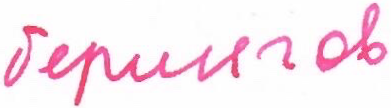берингов
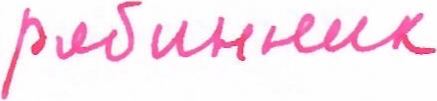рябинник
